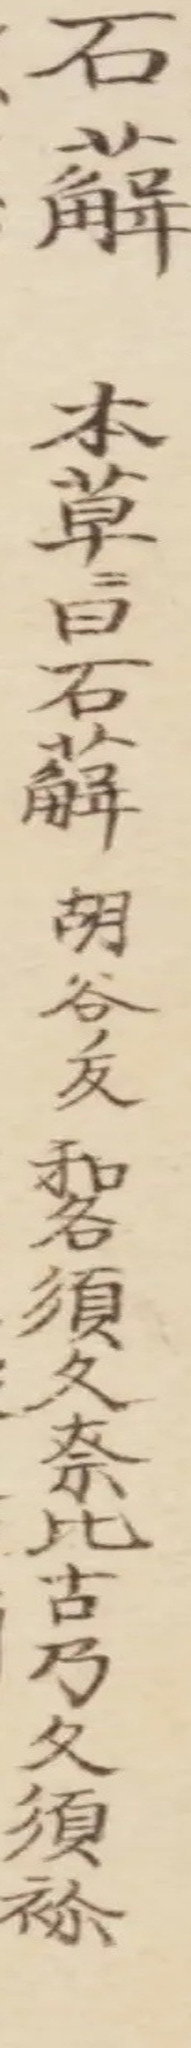石薢本草に石薢胡谷の友和名須久奈良比古之久須祢
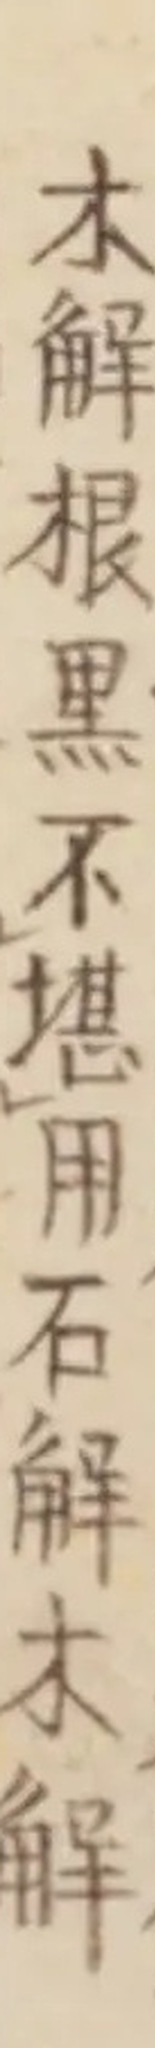木解根黒不堪陽石解木解
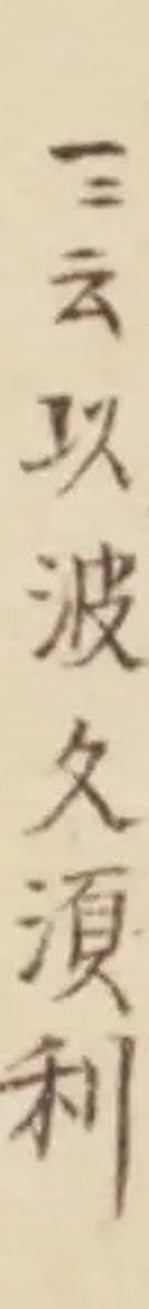一に云う井波久須利
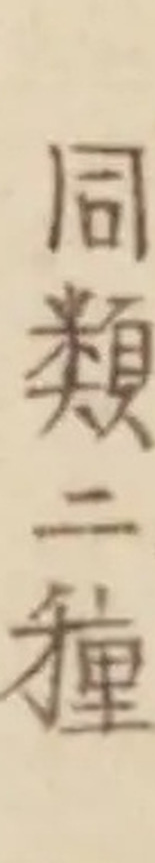同類二種
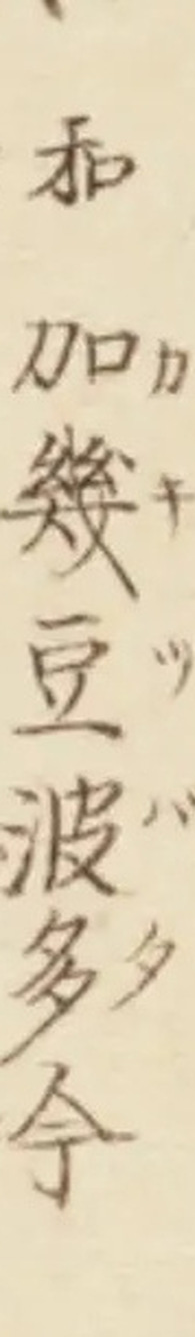蠡實和加幾豆波多今
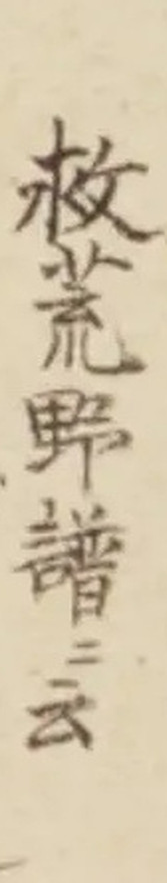救荒野譜に云
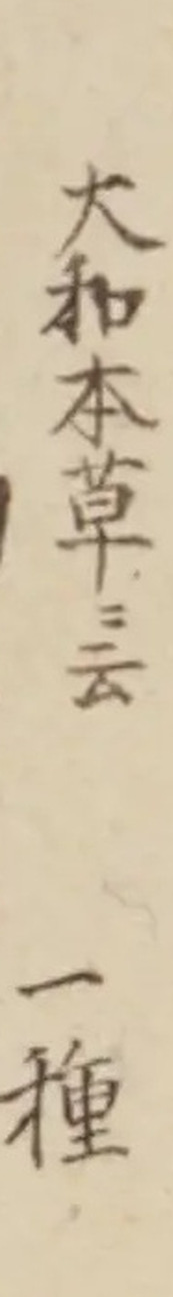大和本草に云一種
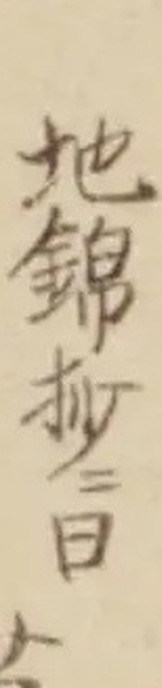地錦抄に曰

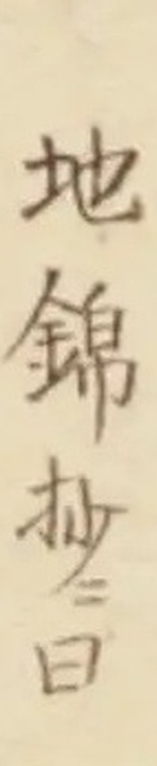地錦抄に曰
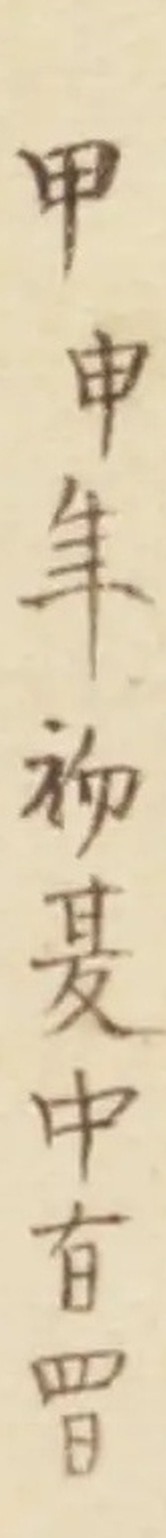甲申年初夏中有四日
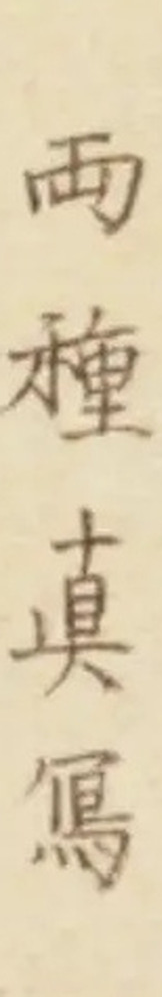両種真寫
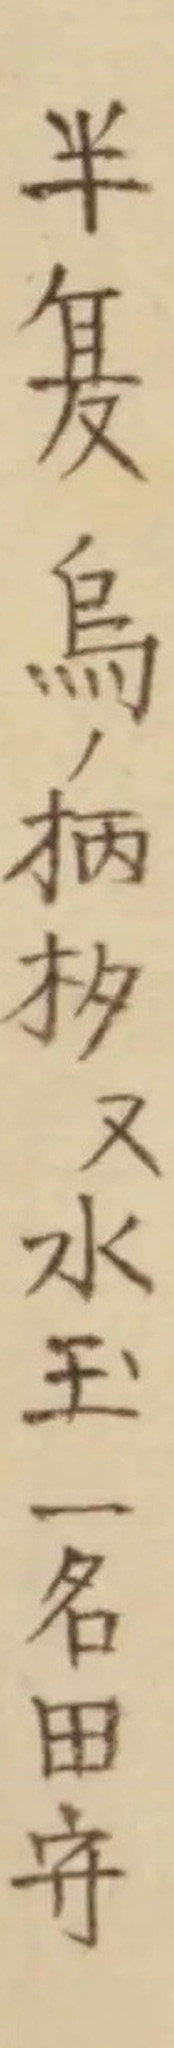半夏烏の柄又水玉一名田守
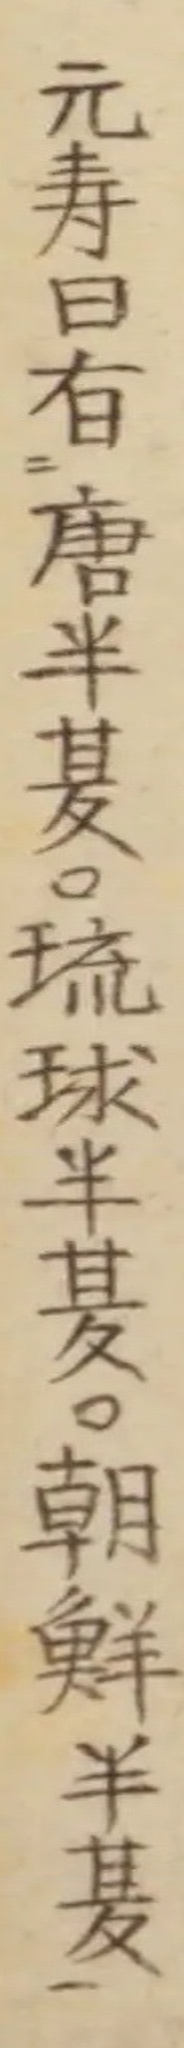元寿曰有唐半夏〇琉球半夏〇朝鮮半夏

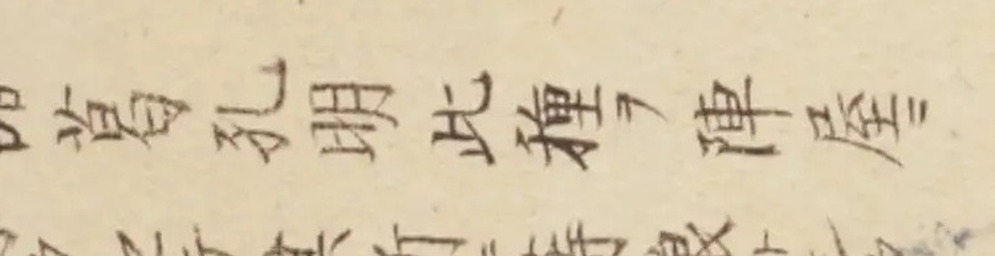諸葛孔明此の種を陣屋に
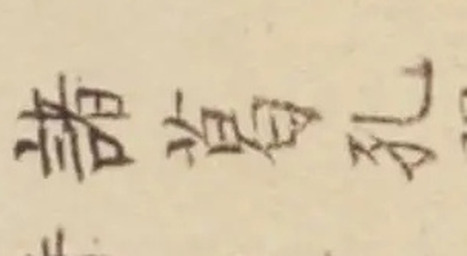諸葛菜
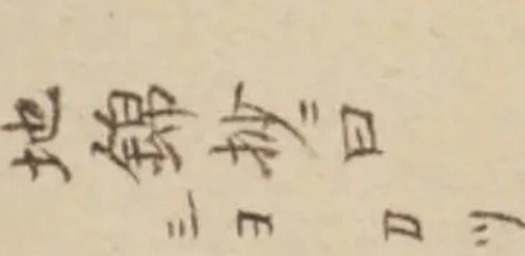地錦抄に曰
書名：梅園草木花譜夏之部. 2
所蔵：国立国会図書館 National Diet Library, JAPAN
